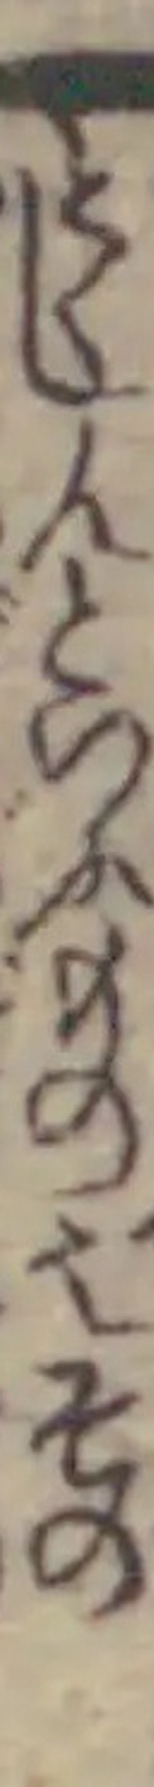とくしんといふもの也その
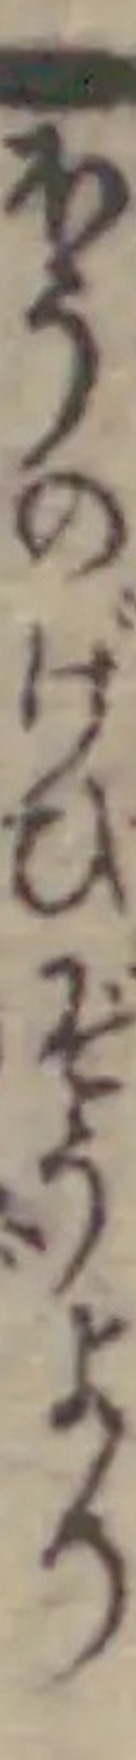ほうのげびぞうより
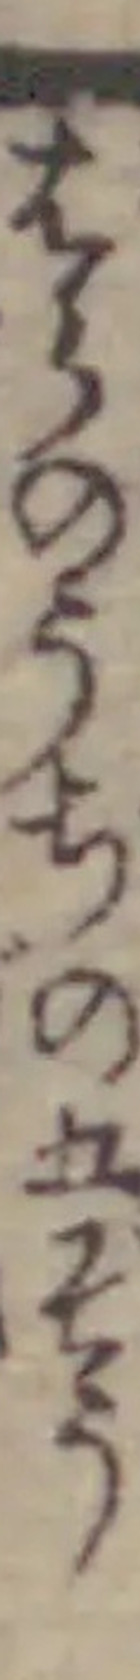はらのうちの五ぞう
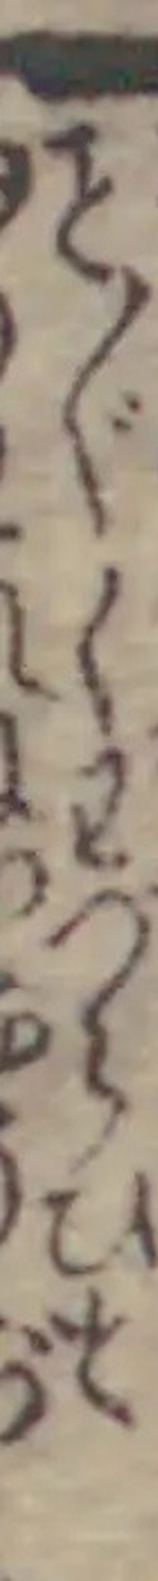こと〴〵くわづらひと
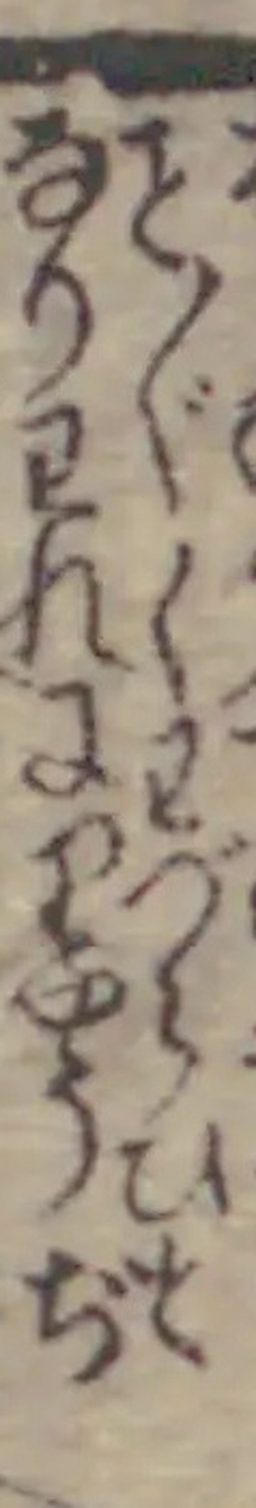なりわれにりやうぢ
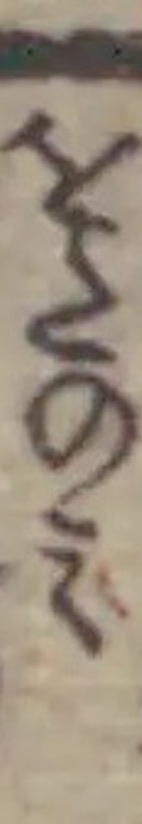をたのみ
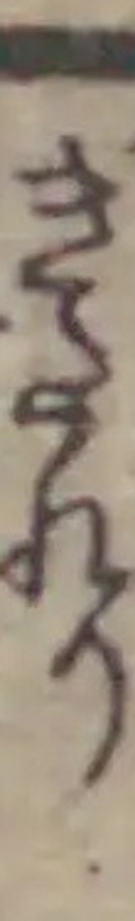きたれり
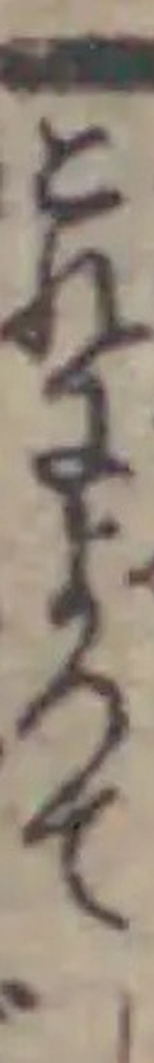これによつて
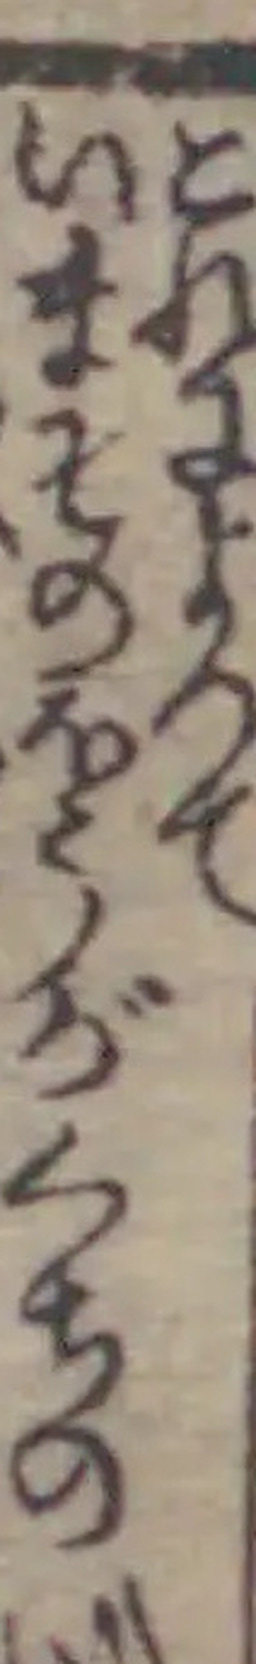いまそのほうがくちの
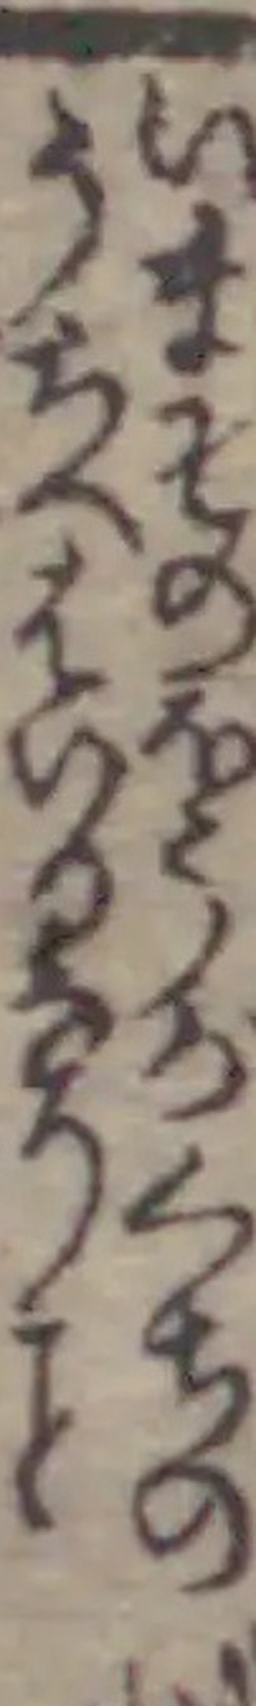うちへはいるなりこと
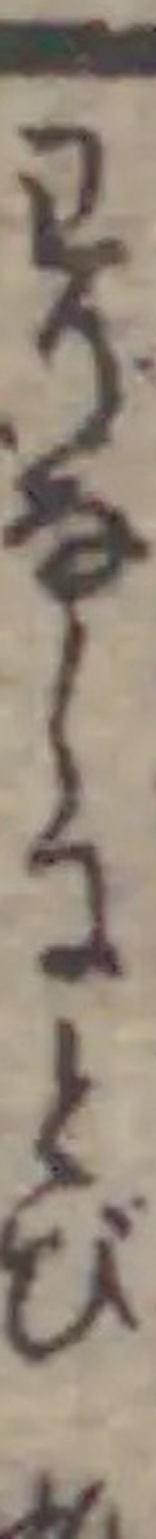わりなしにとび
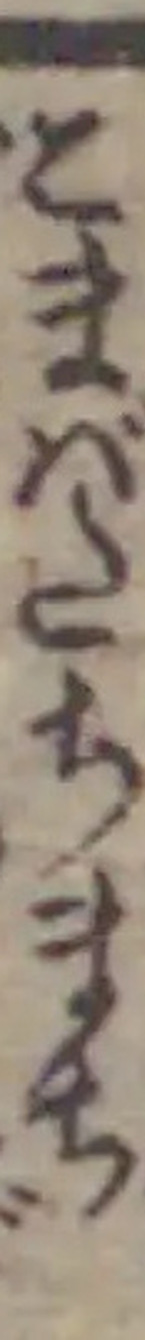こまばたちまち
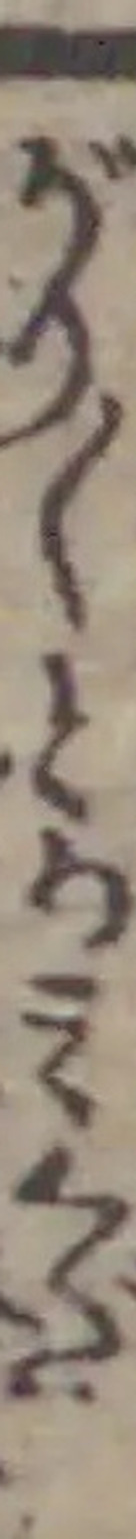がり〳〵とかみくだ
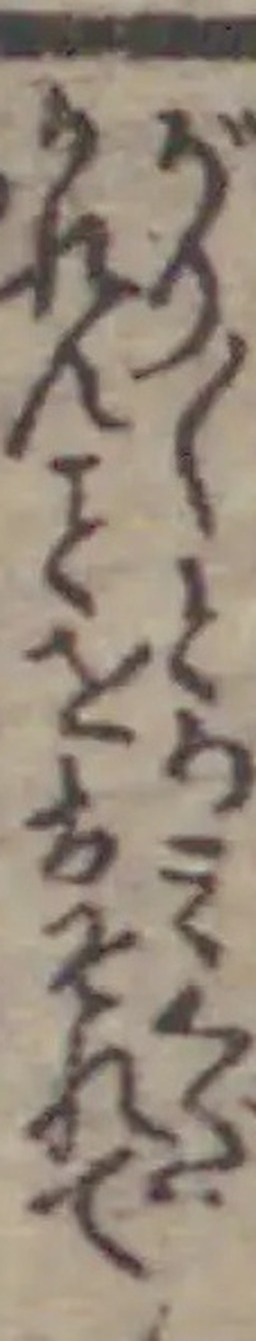かれんことをおそれて
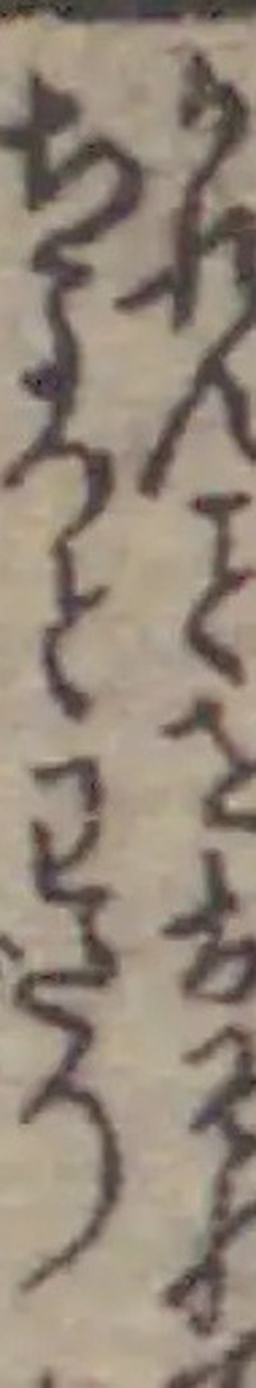ちよつとわたり
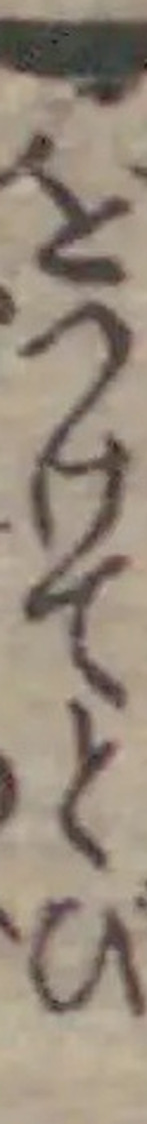をつけてとび
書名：腹内養生主論 3巻
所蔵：国立国会図書館 National Diet Library, JAPAN
